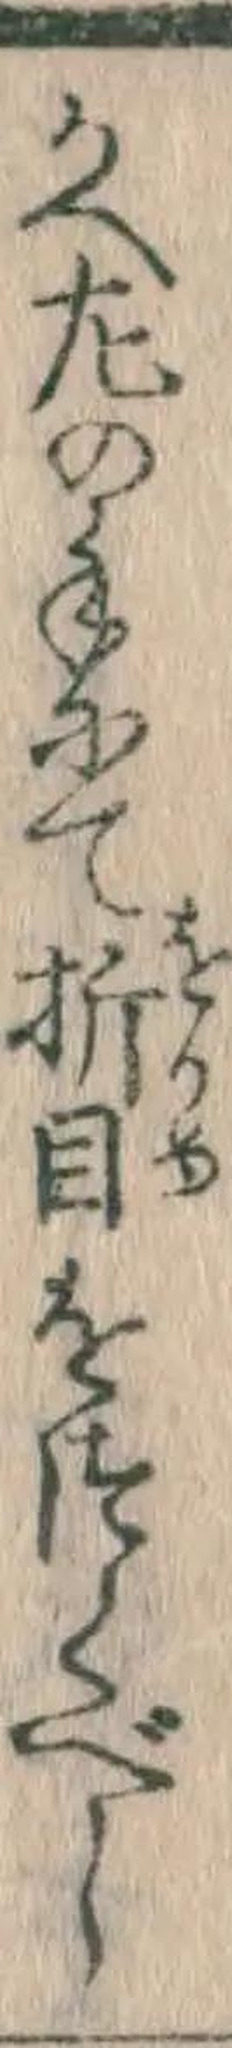かへ左の手にて折目をつくべし
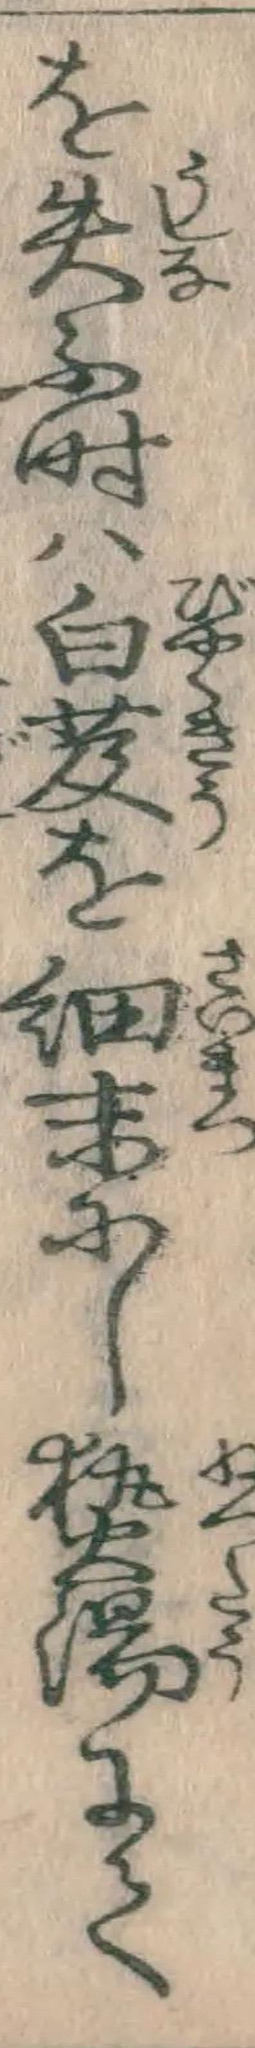を失ふ時は白笈を細末にし熱湯にて
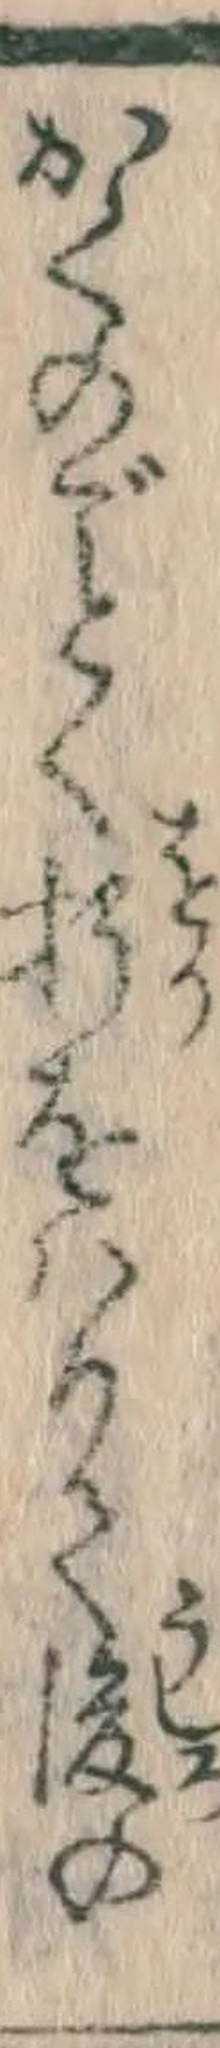かくのごとく折をはりて後の
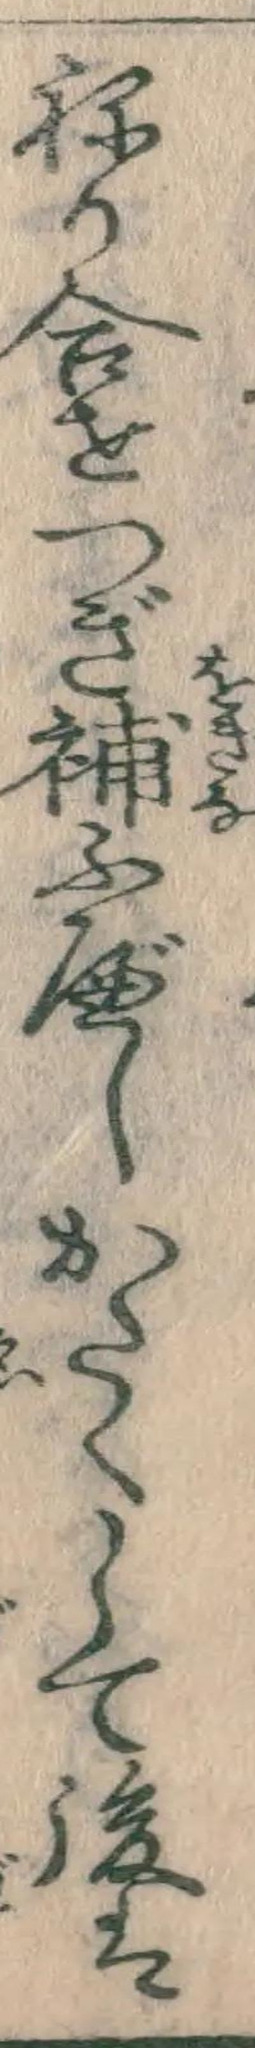ねり合せつぎ補ふべしかたくして後は
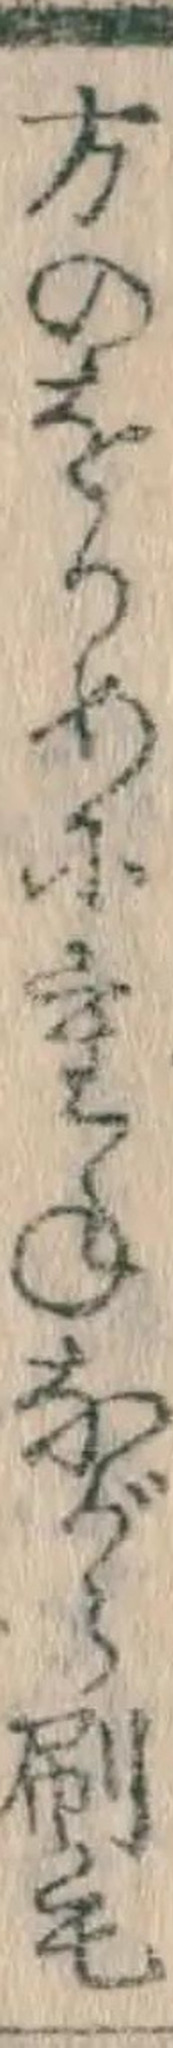方のをりめに重ねながら刷毛
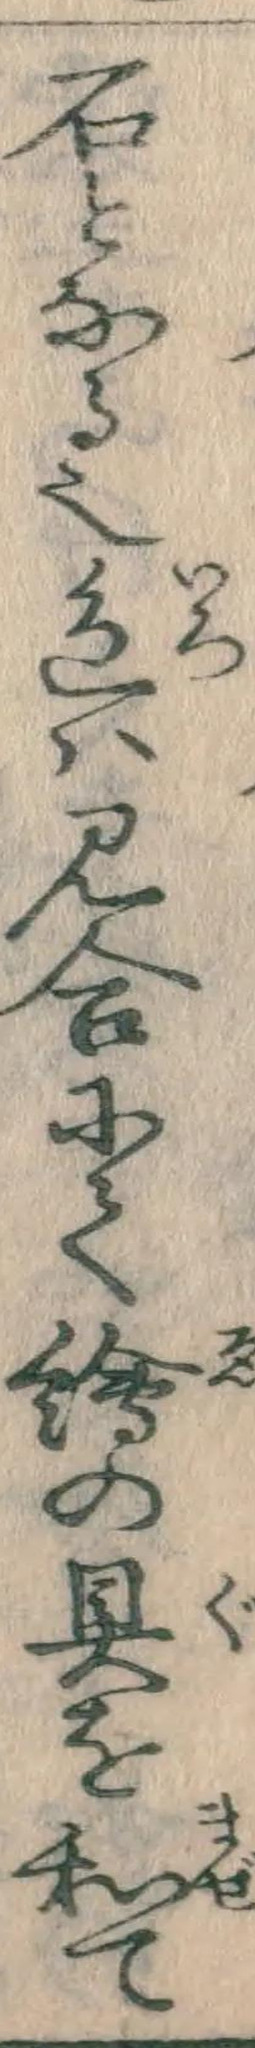石となる也色は見合にて絵の具を和て
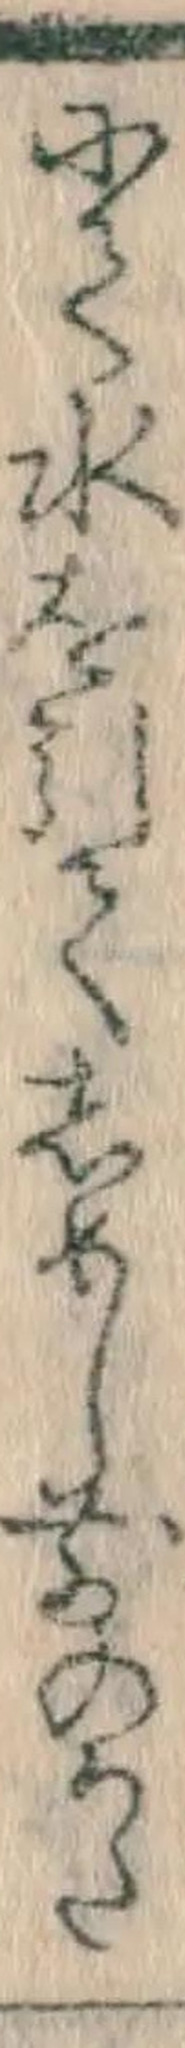にて水を引てしめし前のかた
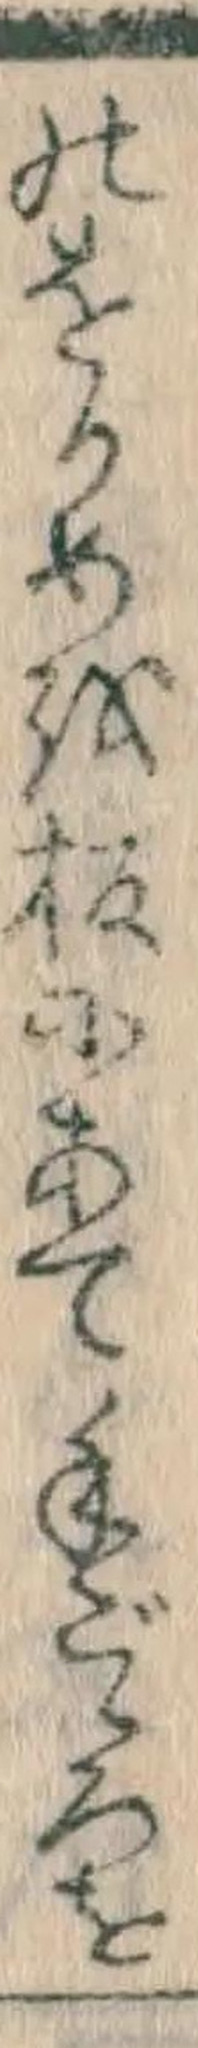のをりめを板にあて手ごゝろを
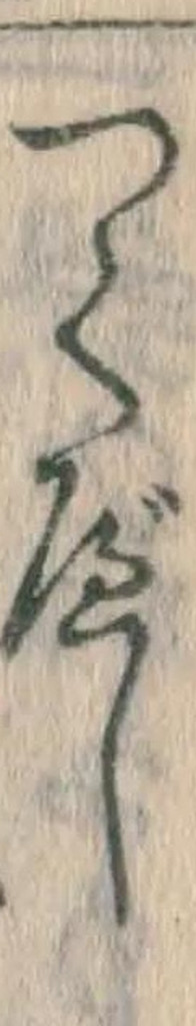つくべし
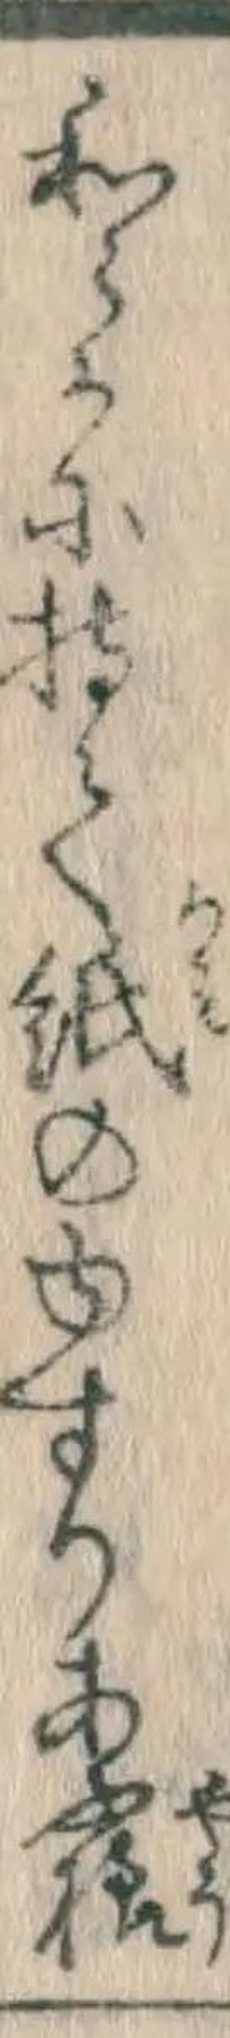和らかに持て紙のゆすりあふ様
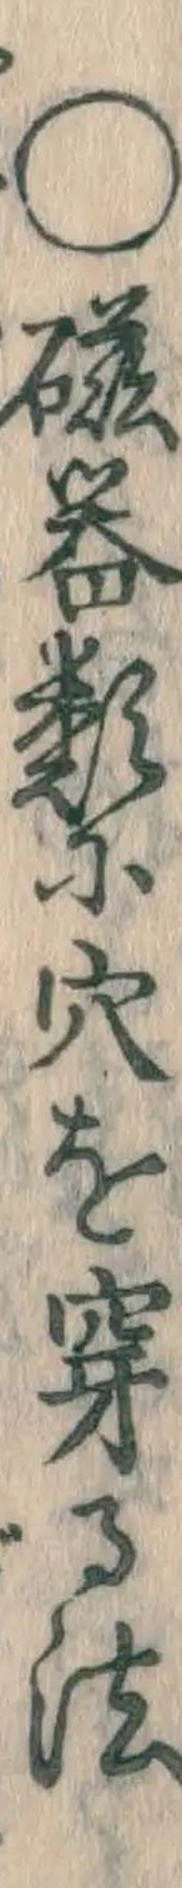○磁器類に穴を穿る法
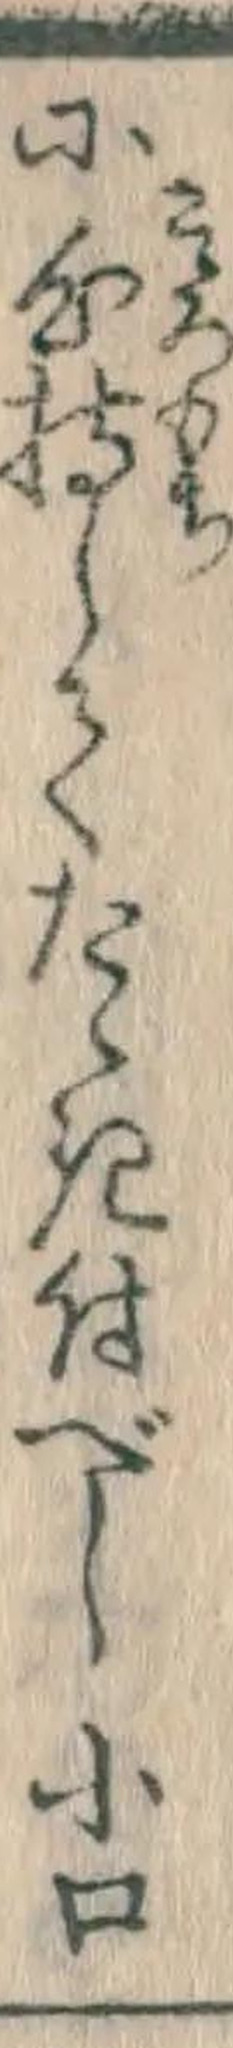に心持してたゝき付べし小口
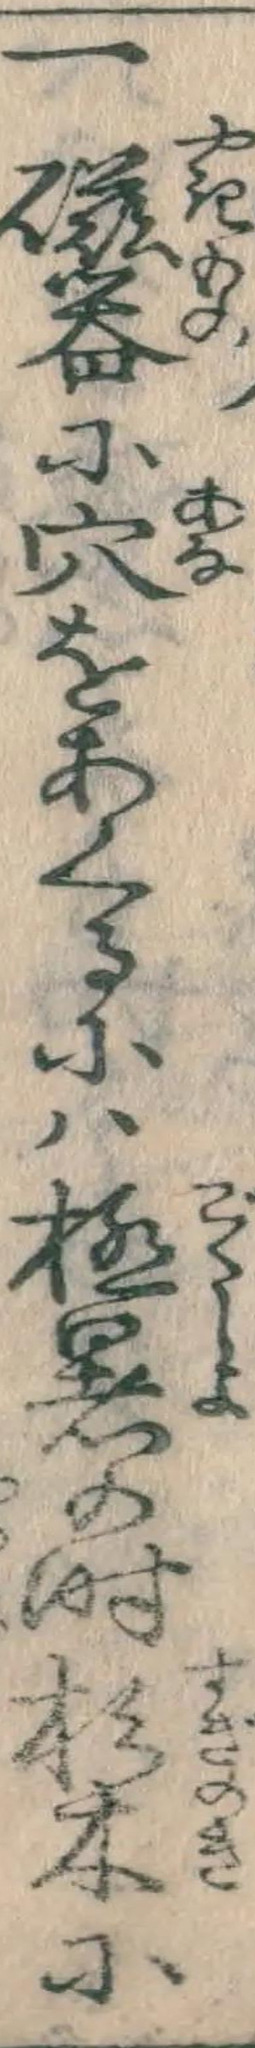一磁器に穴をあくるには極暑の時杉木に
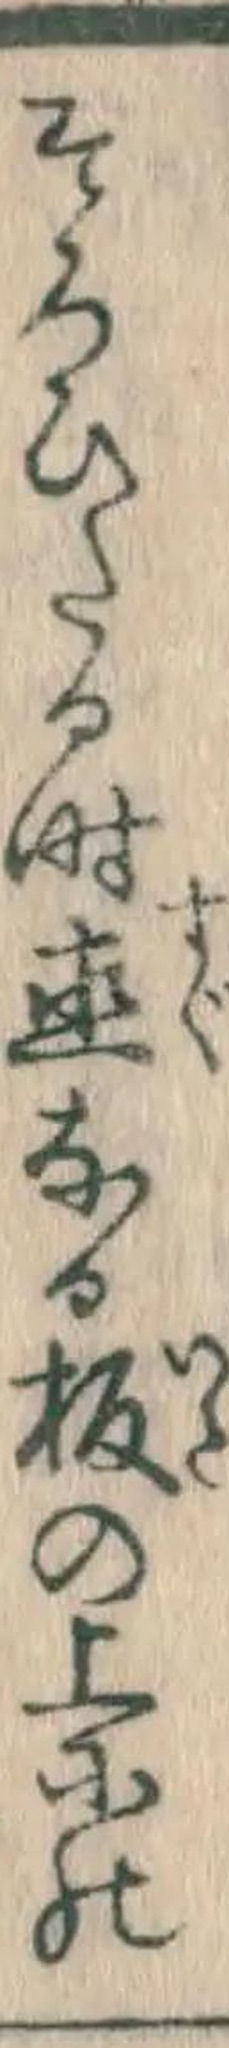そろひたる時直なる板の上にの
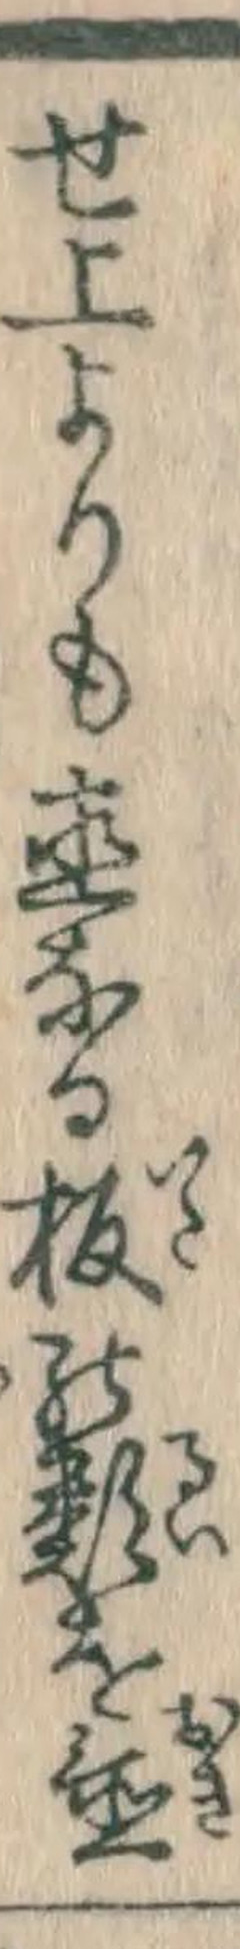せ上より直なる板の類を置
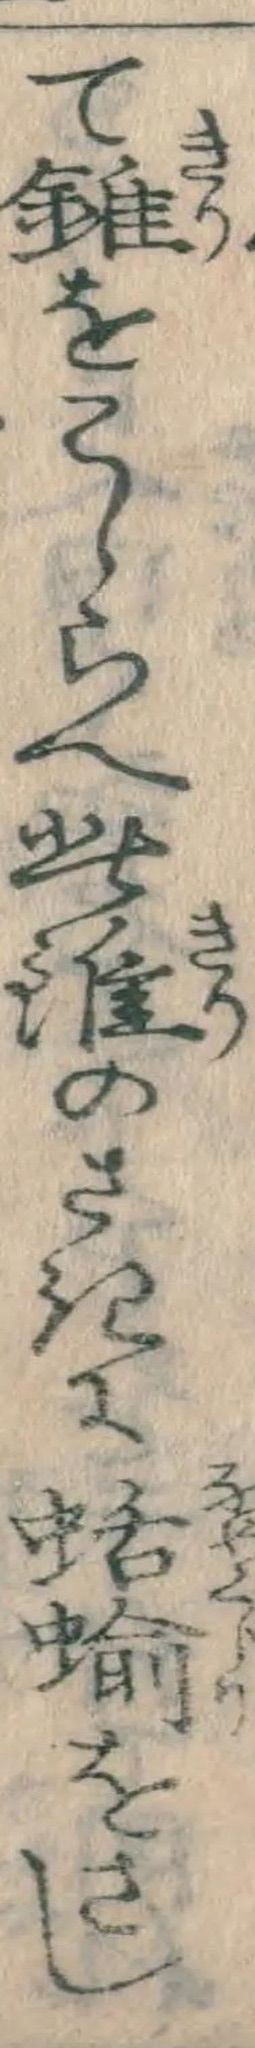て錐をこしらへ此錐のさきに蛞蝓をさし
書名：広益秘事大全 3巻. [2]
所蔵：国立国会図書館 National Diet Library, JAPAN
